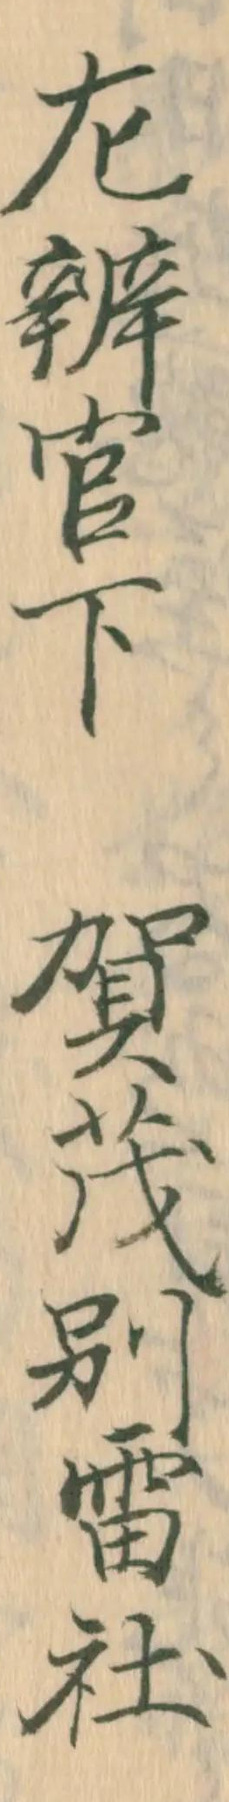左弁官下賀茂別雷社
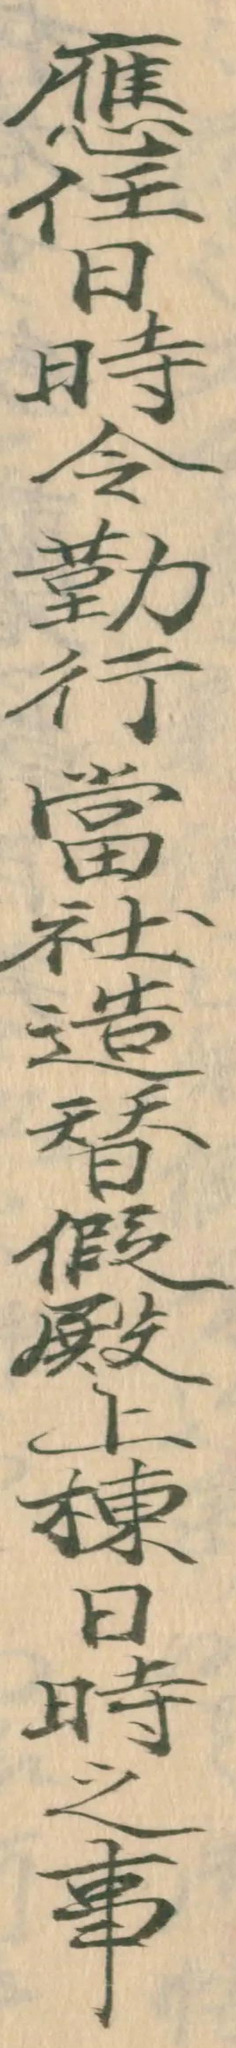応任日時令勤行当社造替仮殿上棟日時之事
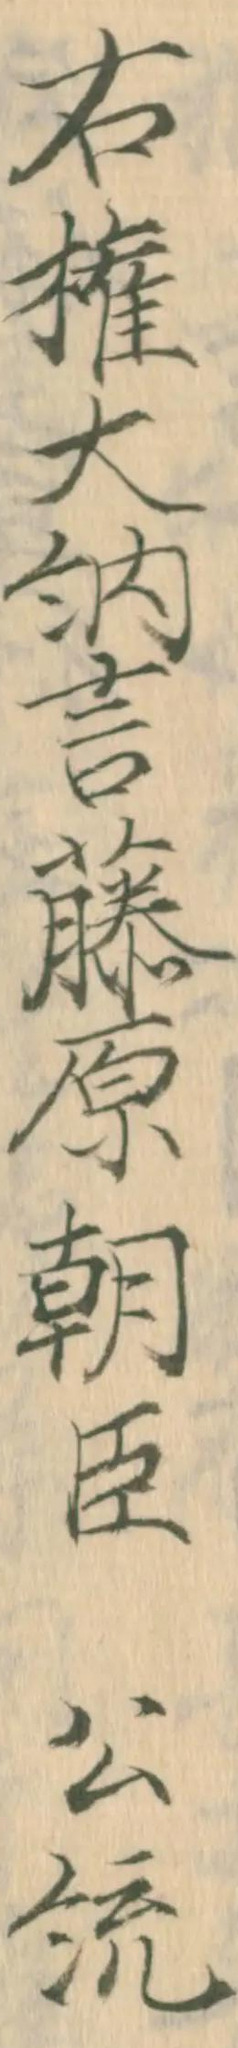右権大納言藤原朝臣公統
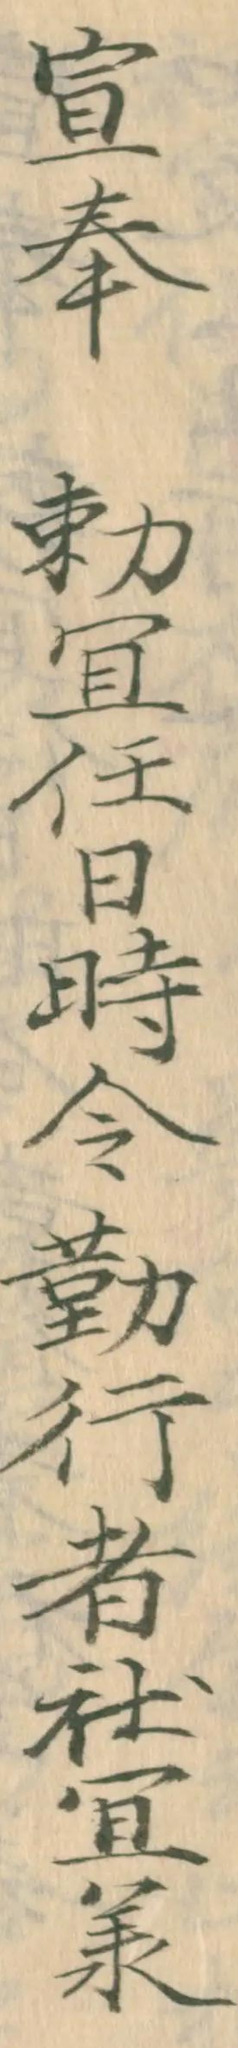宣奉勅宜任日時令勤行者社宜承
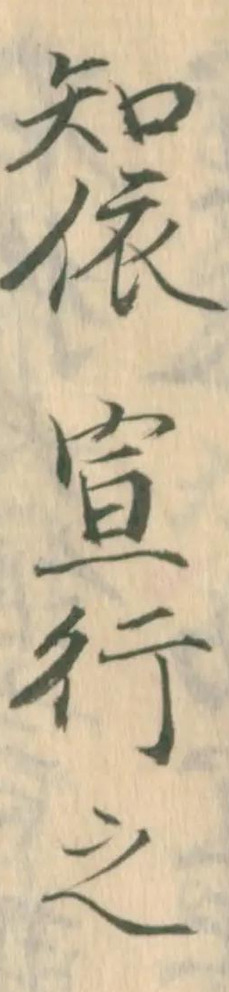知依宣行之
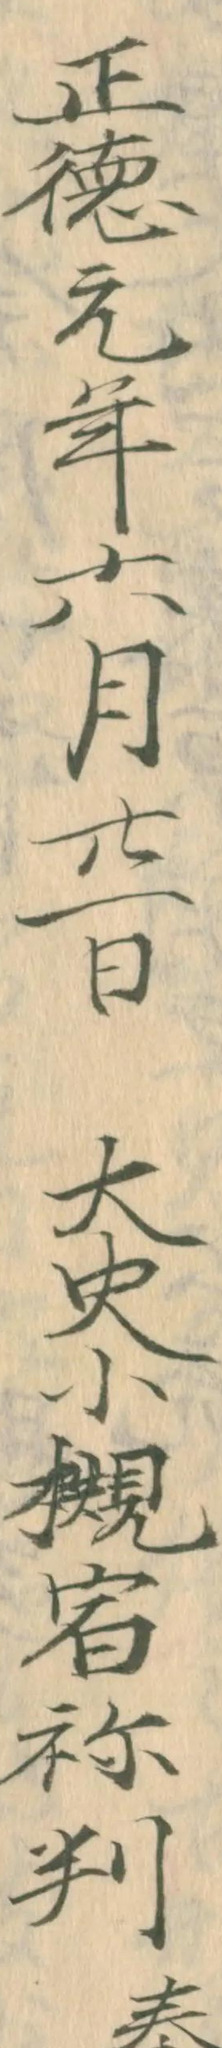正徳元年六月廿一日大史小槻宿祢判奉
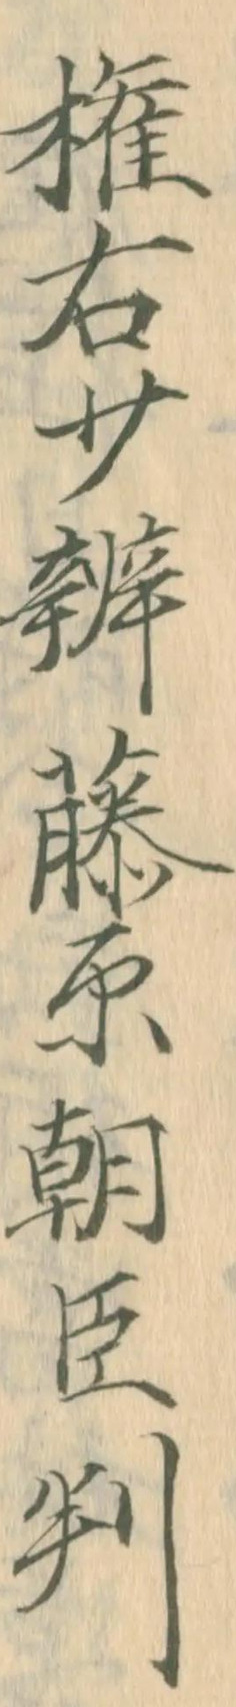権右少弁藤原朝臣判

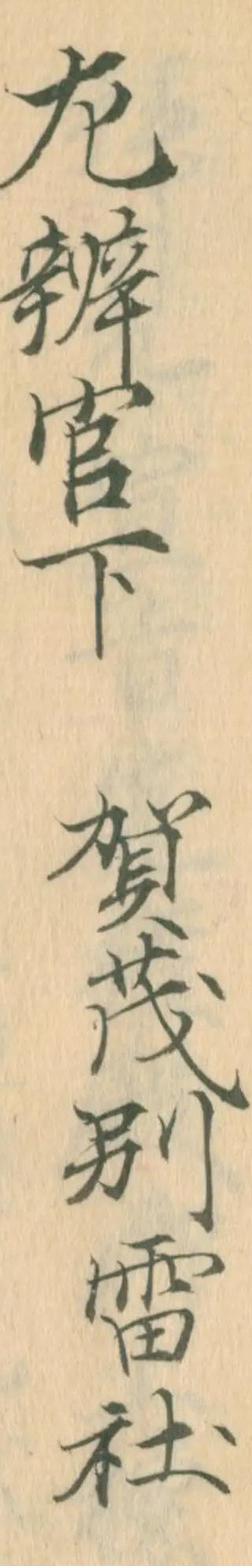左弁官下賀茂別雷社
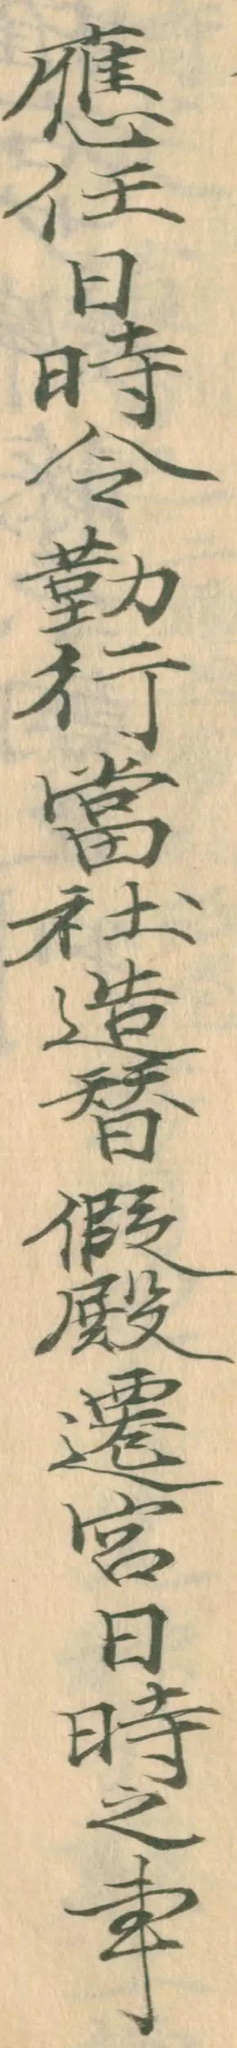応任日時令勤行当社造替仮殿遷宮日時之事
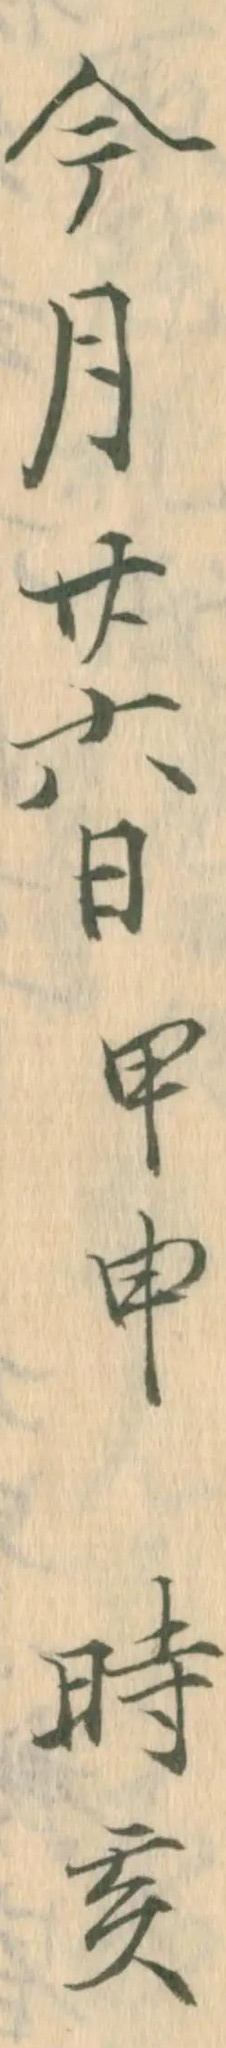今月廿六日甲申時亥
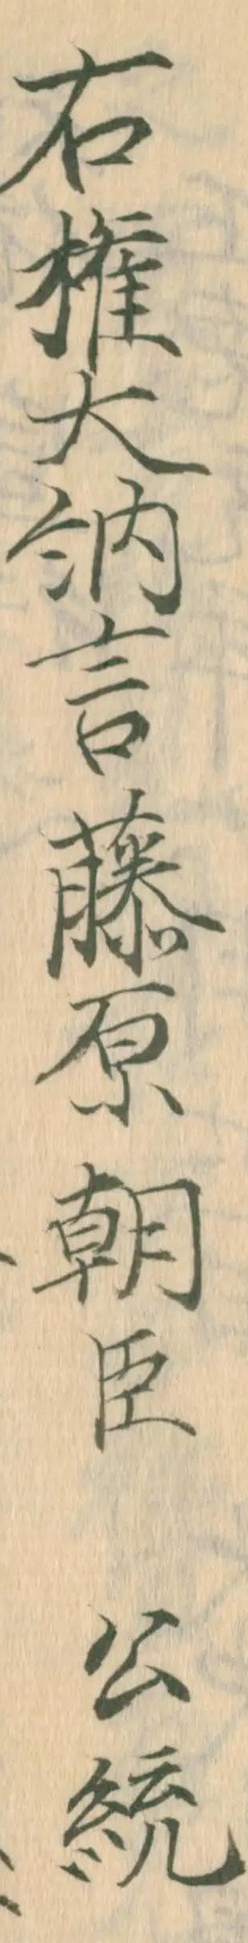右権大納言藤原朝臣公統
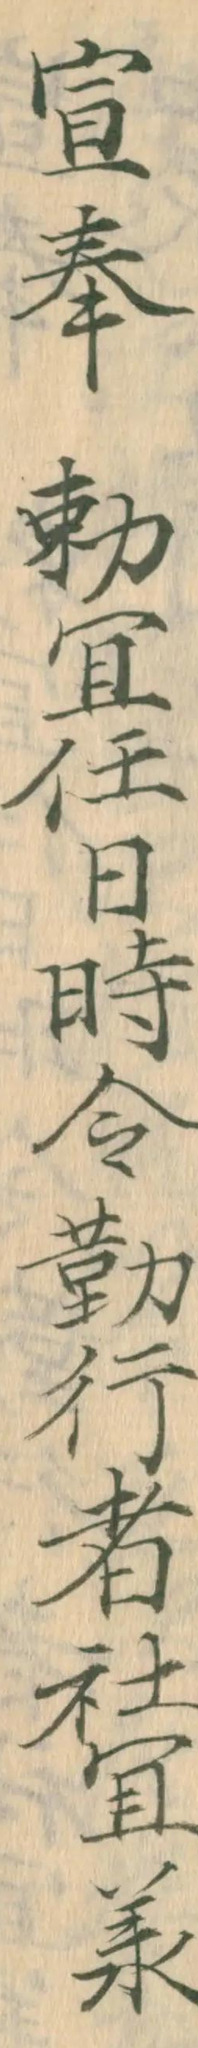宣奉勅宜任日時令勤行者社宜承
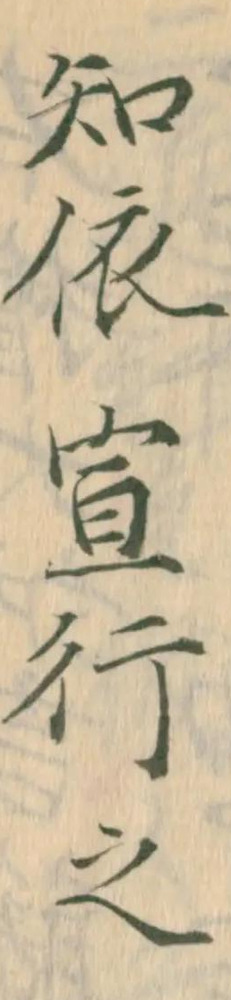知依宣行之
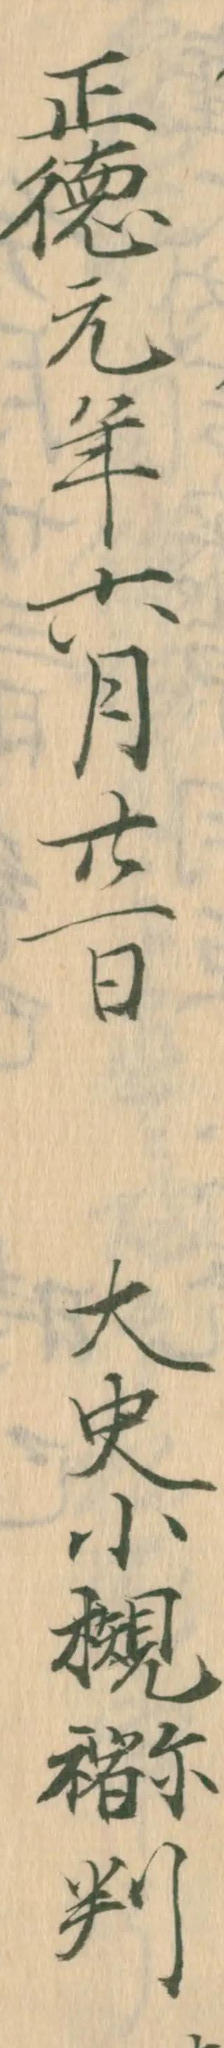正徳元年六月廿一日大史小槻判奉
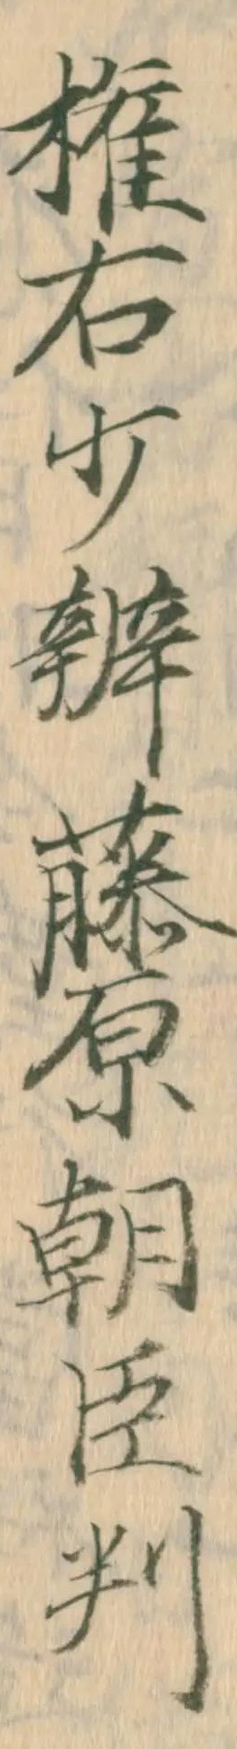權右少弁藤原朝臣判
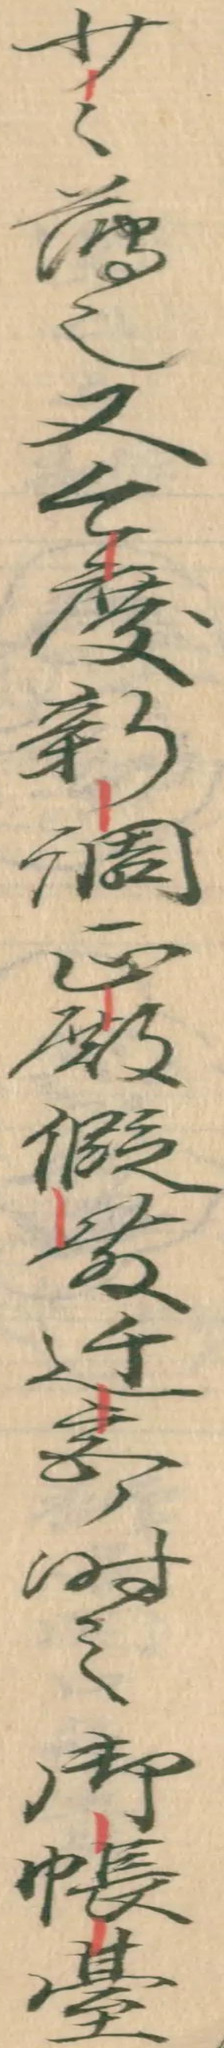少-々薄也又今-度新-調正-殿仮_殿迁-宮ノ時之御-帳-台
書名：賀茂社記録. 第15冊
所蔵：国立国会図書館 National Diet Library, JAPAN
